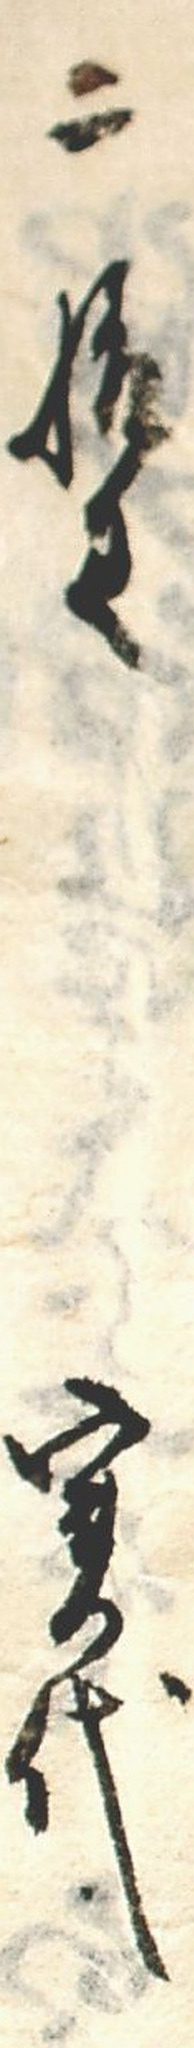一拾匁実代
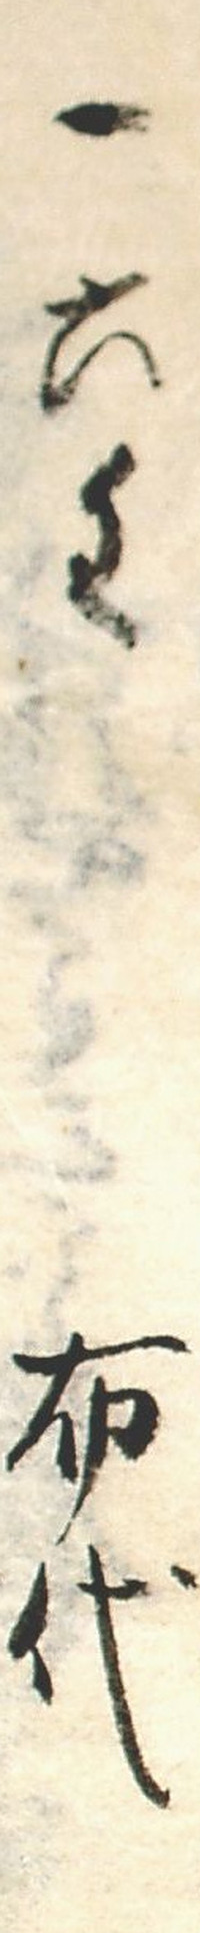一六匁布代
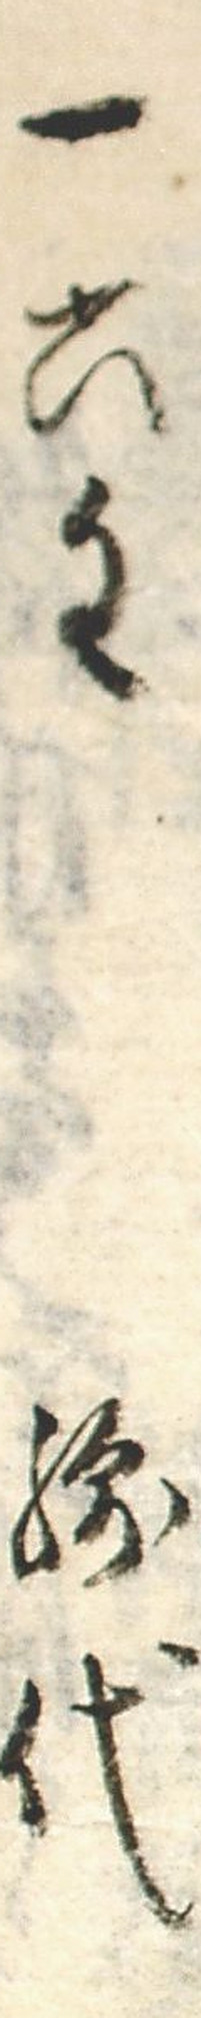一六匁綿代
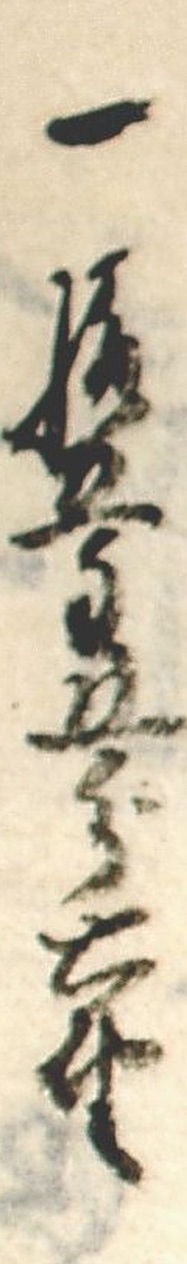九拾六匁壱分六厘
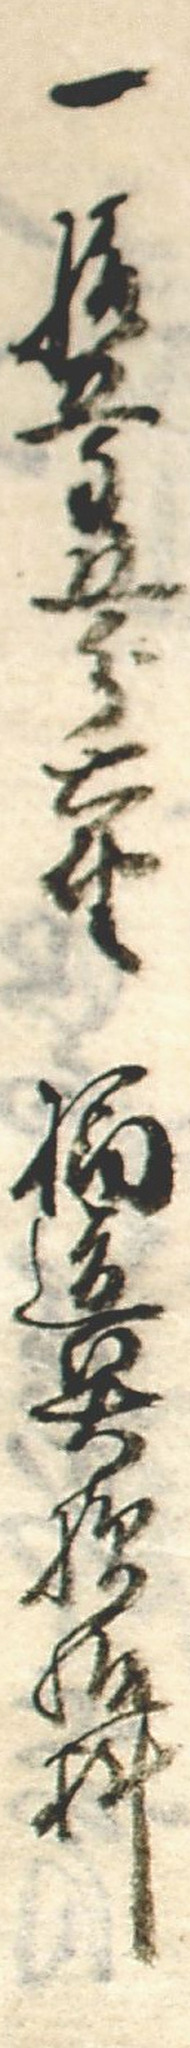一拾五匁五分六厘桶道具損給料
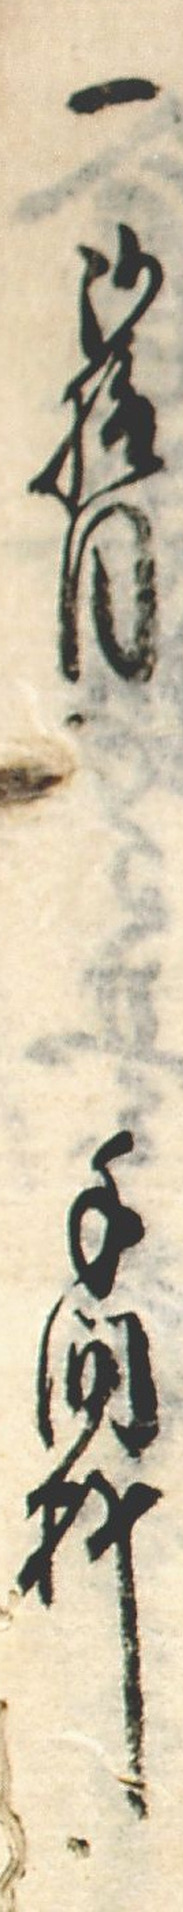一弐拾目手間料

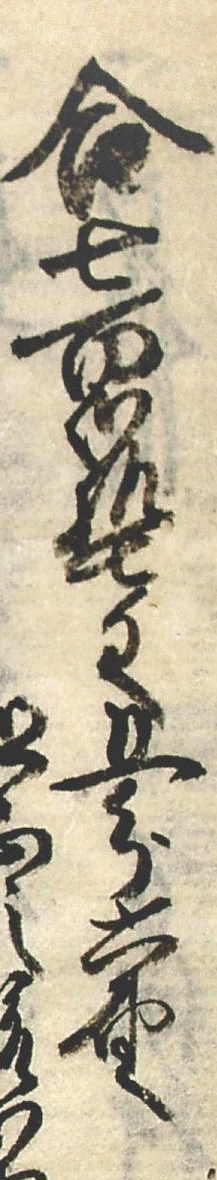合七百弐拾七匁五分六厘
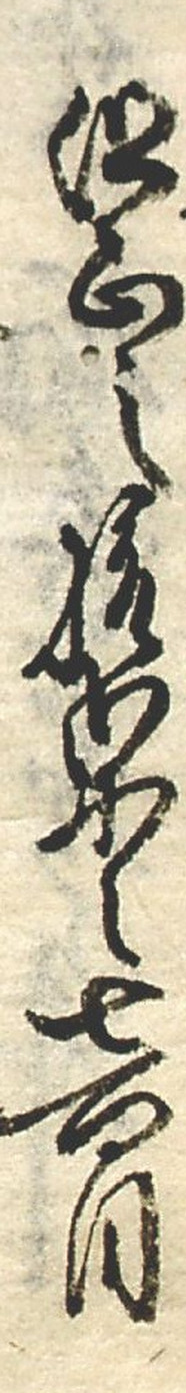但正ミ拾弐貫七百目
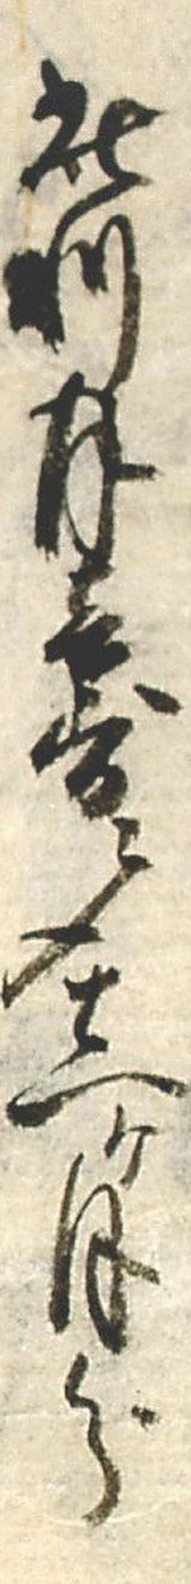此利月壱歩にして十二ケ月分
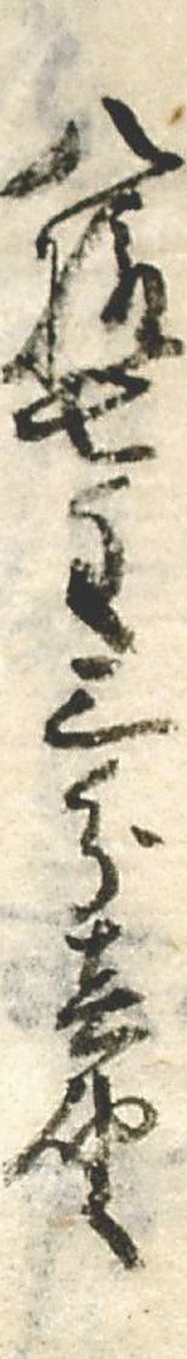八拾七匁三分壱厘
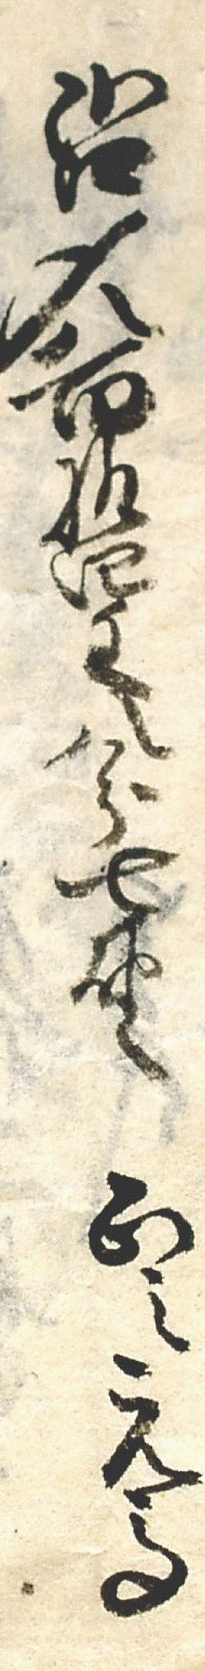弐口〆八百拾四匁八分七厘正ミ元高
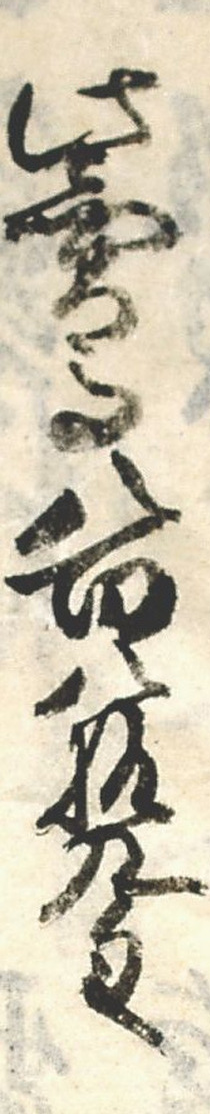此売高八百八拾九匁
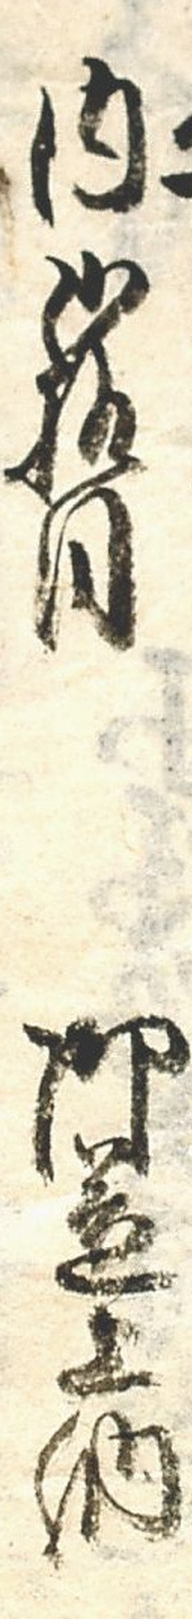内弐拾目御益上納
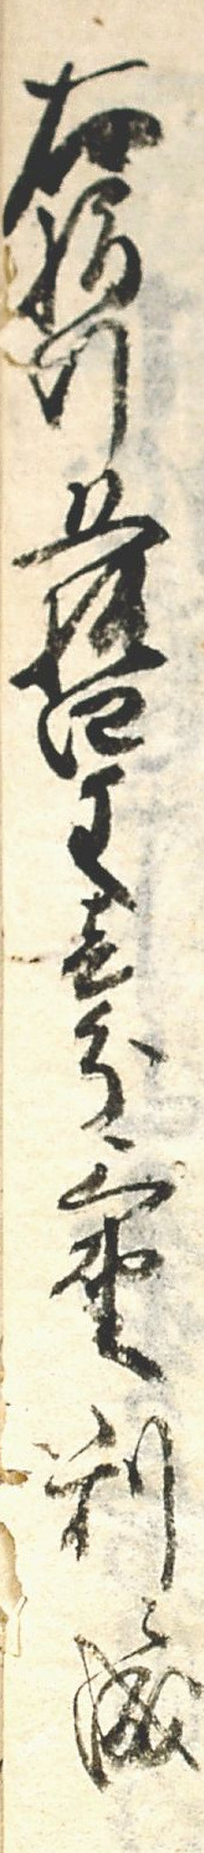右指引五拾四匁壱分三厘利に成
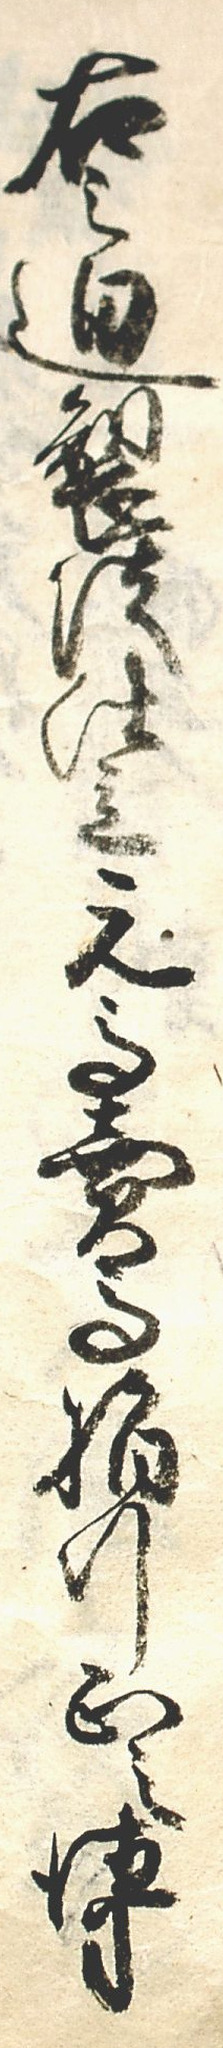右之通製法仕立元高売高指引正ミ値方
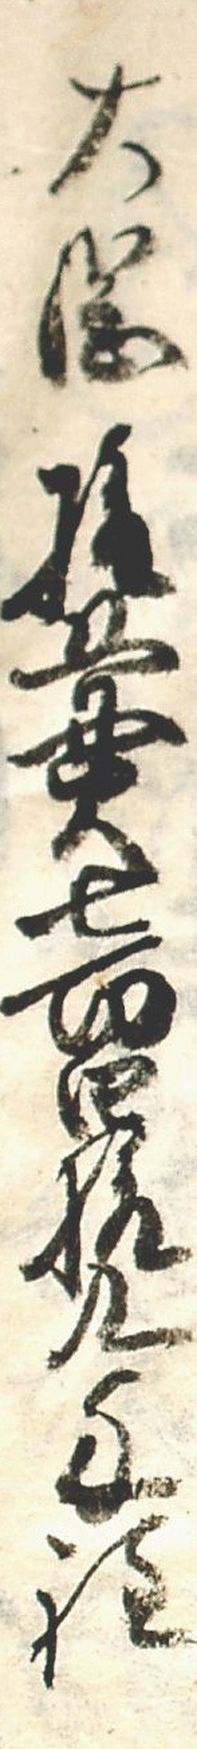大綱拾五貫七百四拾九匁程
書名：御国産漆製法越法算建書共取替速判帳
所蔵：鳴門教育大学 Naruto University of Education
